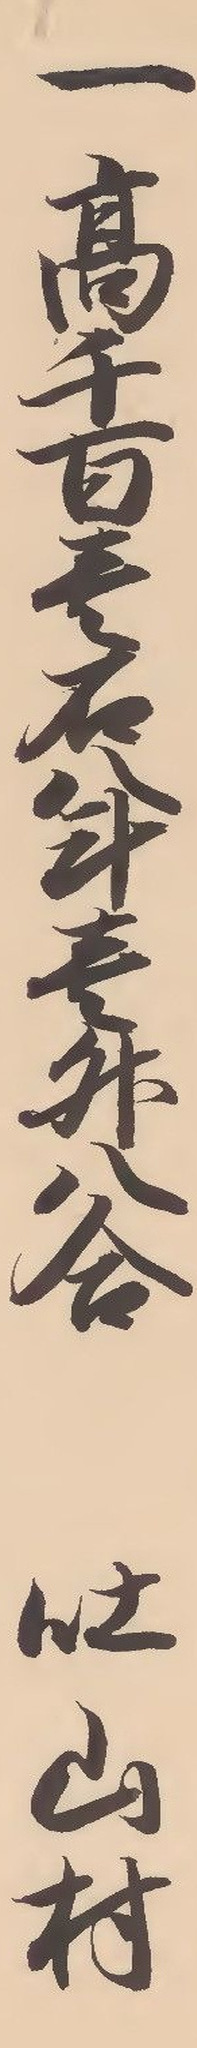一高千百壱石八斗壱升八合吐山村
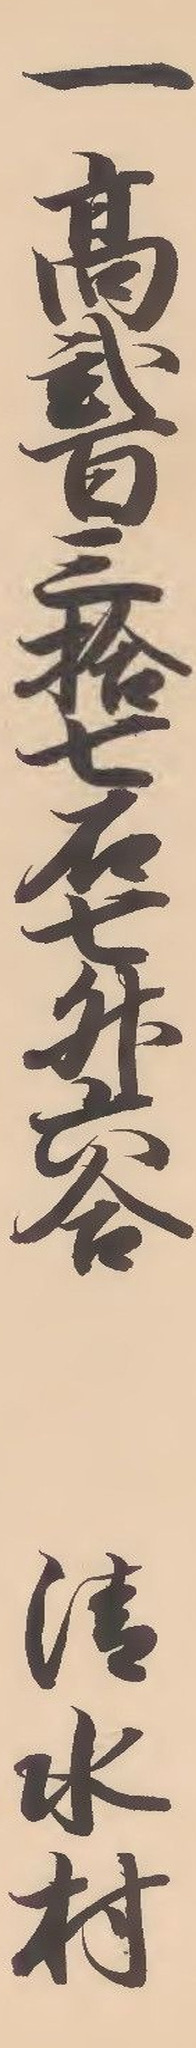一高弐百三拾七石七升六合清水村

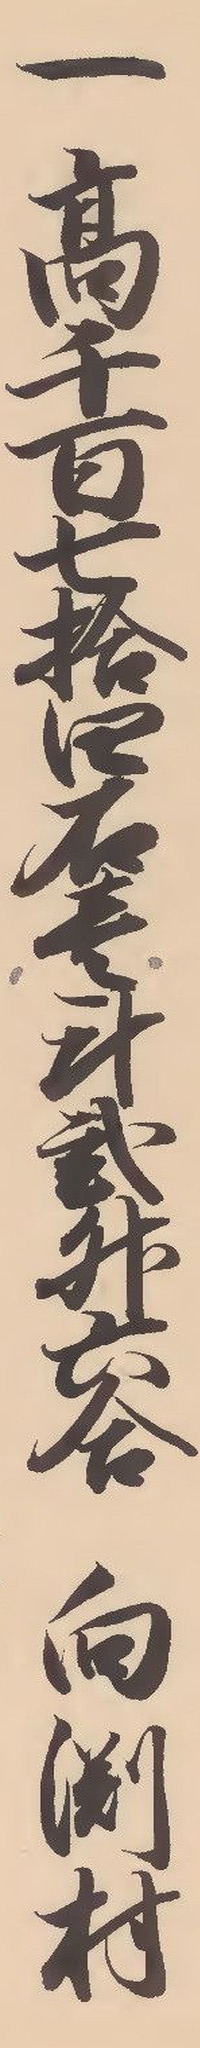一高千百七拾四石壱斗弐升六合向淵村
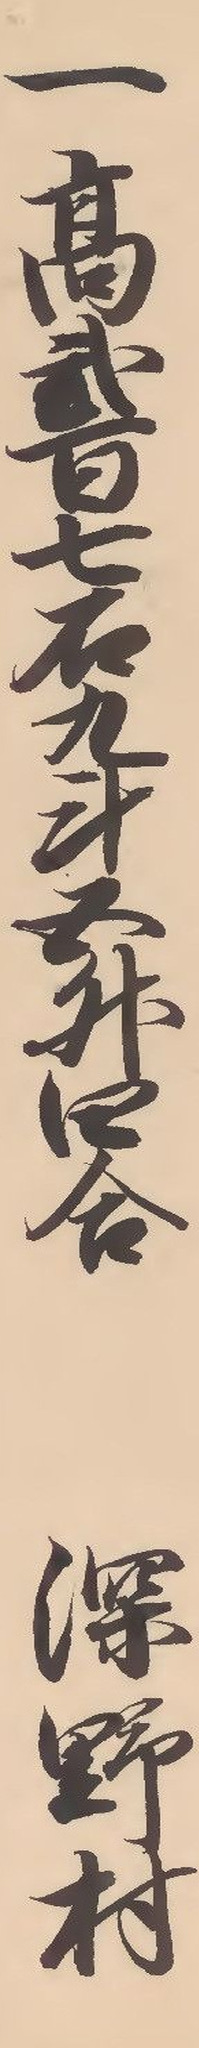一高弐百七石九斗五升四合深野村
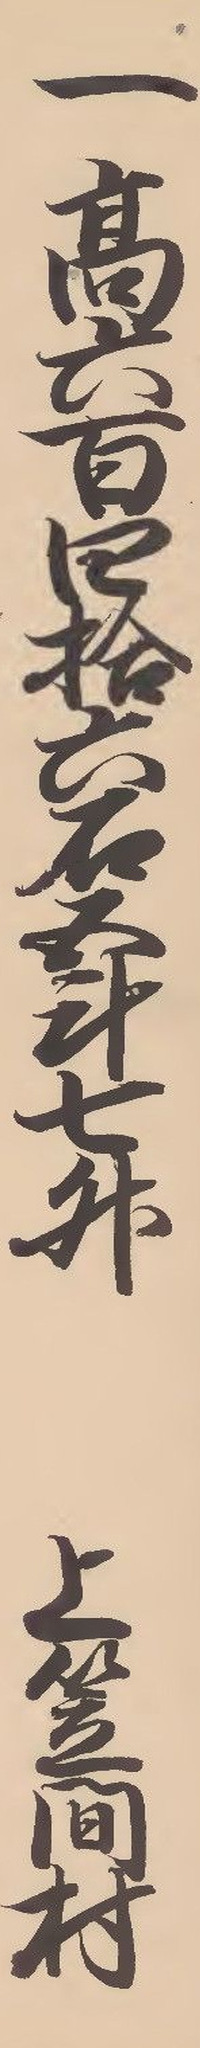一高六百四拾六石五斗七升上笠間村
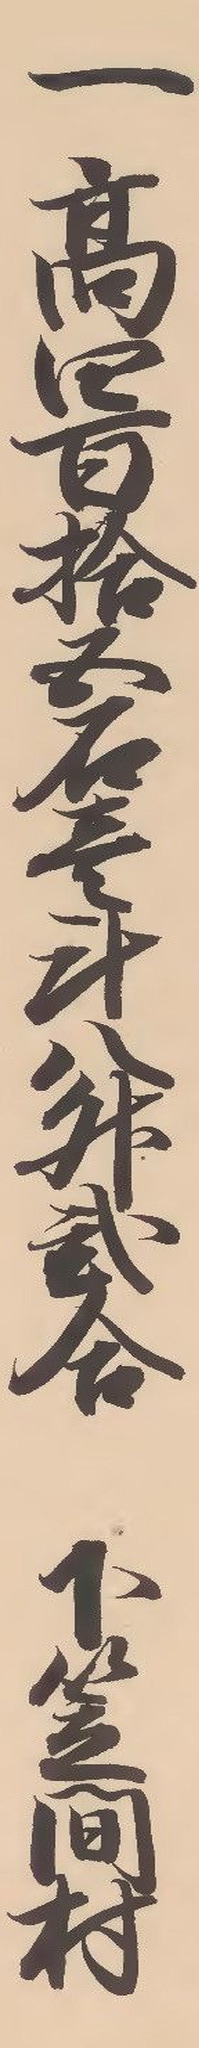一高四百拾五石壱斗八升弐合下笠間村
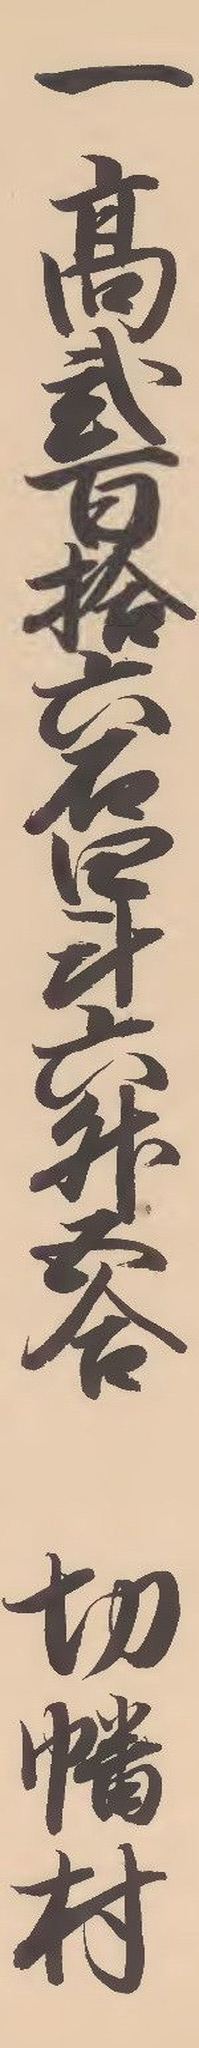一高弐百拾六石四斗六升五合切幡村
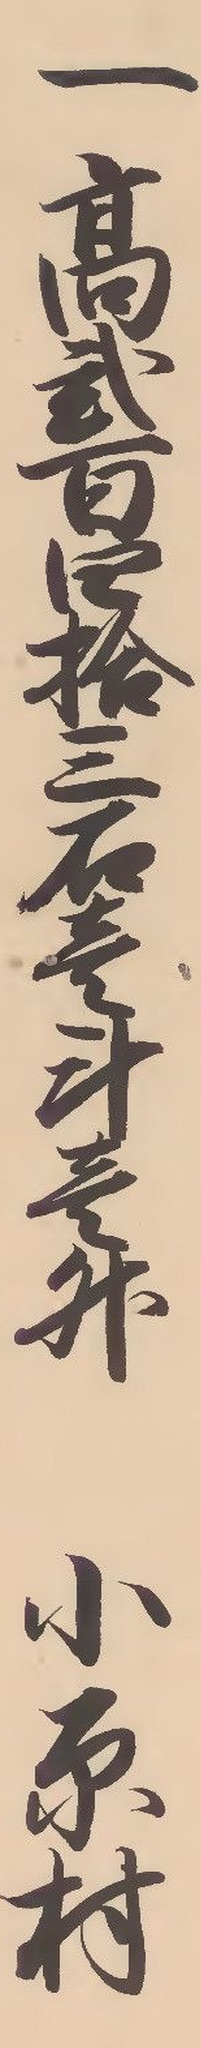一高弐百四拾三石壱斗壱升小原村

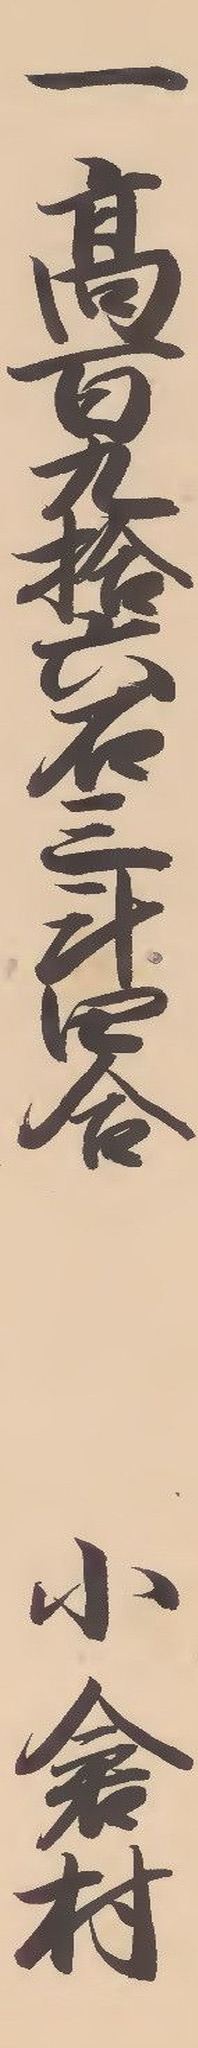一高百九拾六石三斗四合小倉村
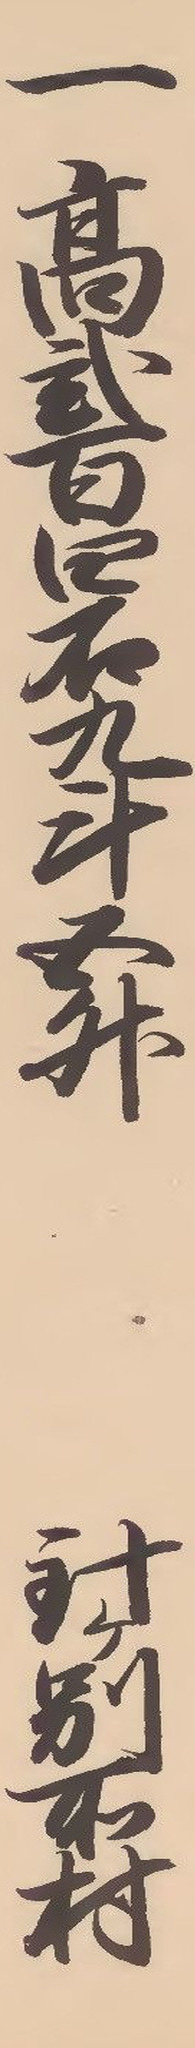一高弐百四石九斗五升針ヶ別所村
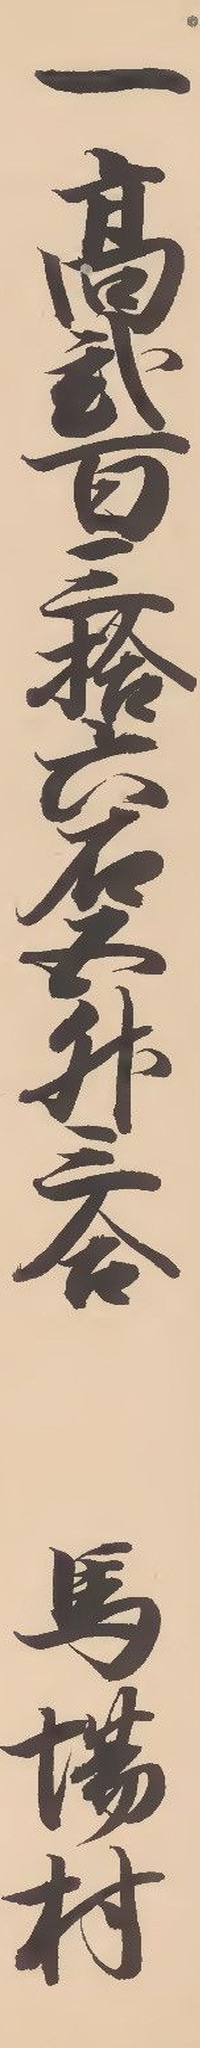一高弐百三拾六石五升三合馬場村
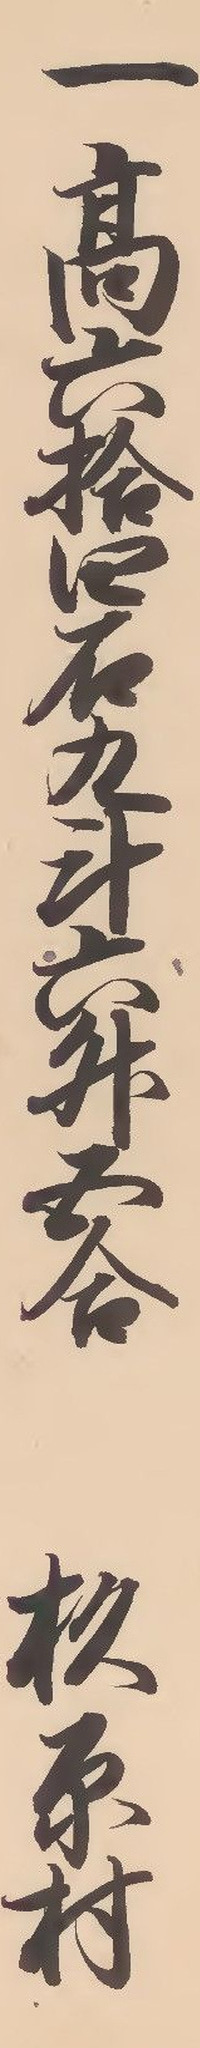一高六拾四石九斗六升五合杉原村

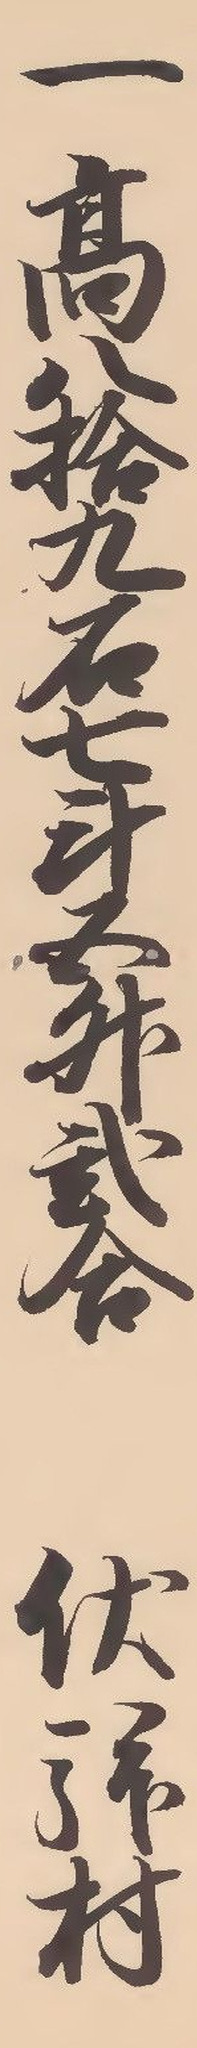一高八拾九石七斗五升弐合伏拝村
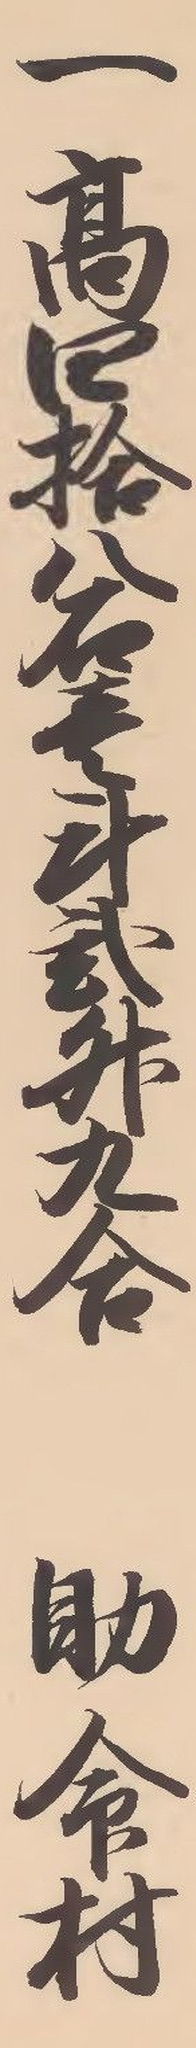一高四拾八石壱斗弐升九合助命村
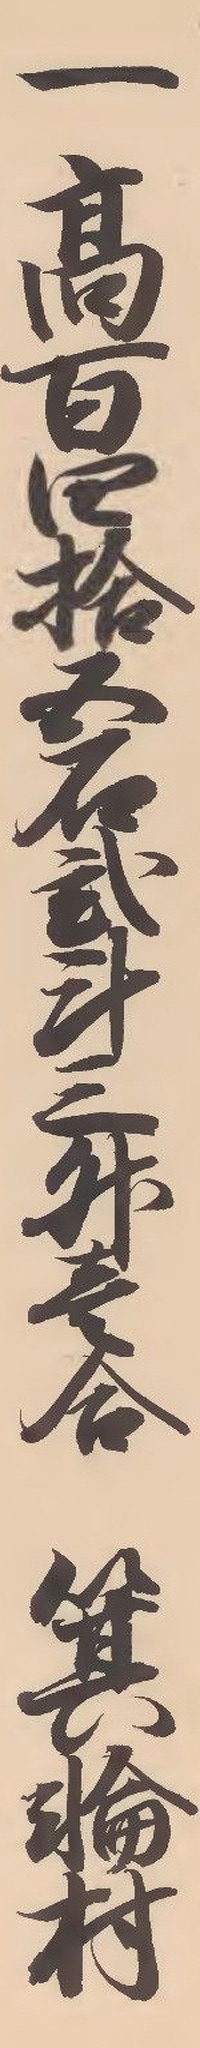一高百四拾五石弐斗三升壱合箕輪村
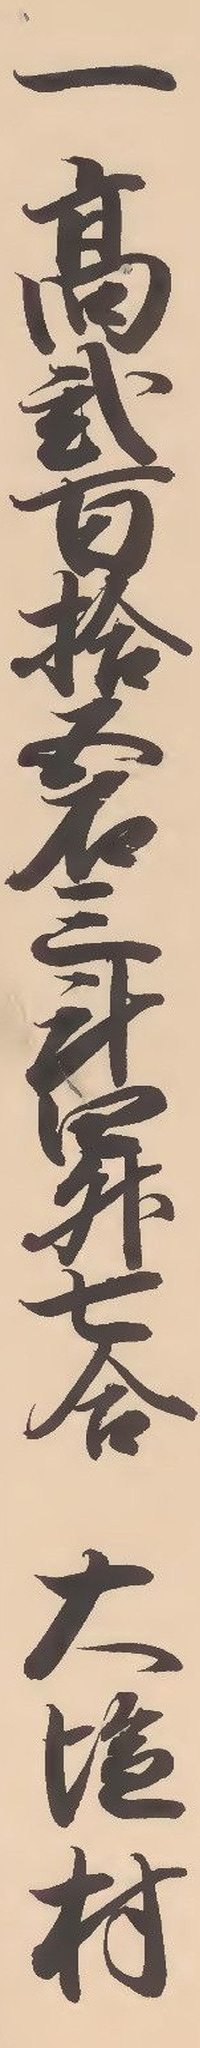一高弐百拾五石三斗四升七合大塩村
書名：大和国郷帳
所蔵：国立公文書館 National Archives of Japan
